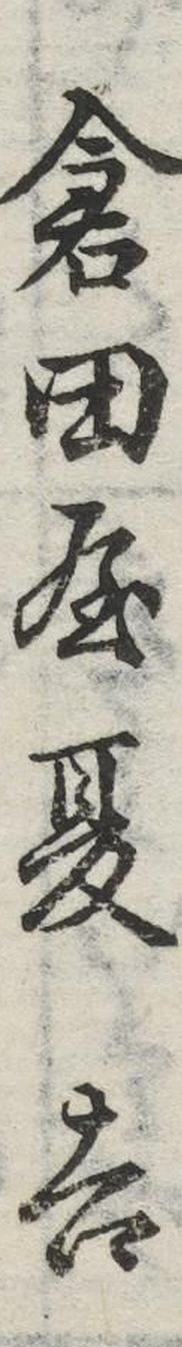倉田屋夏吉
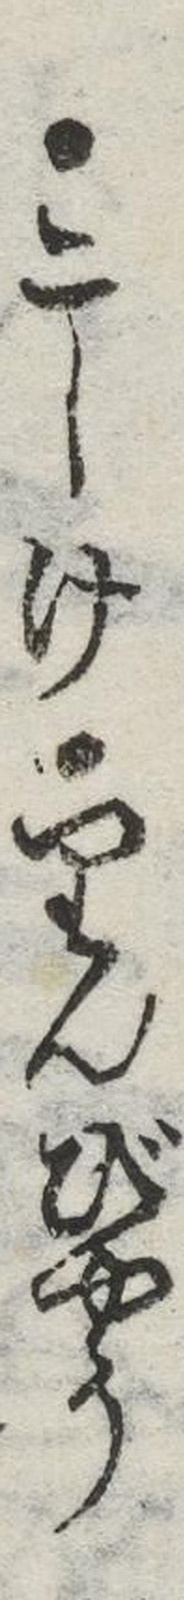●こしけ●りんびやう
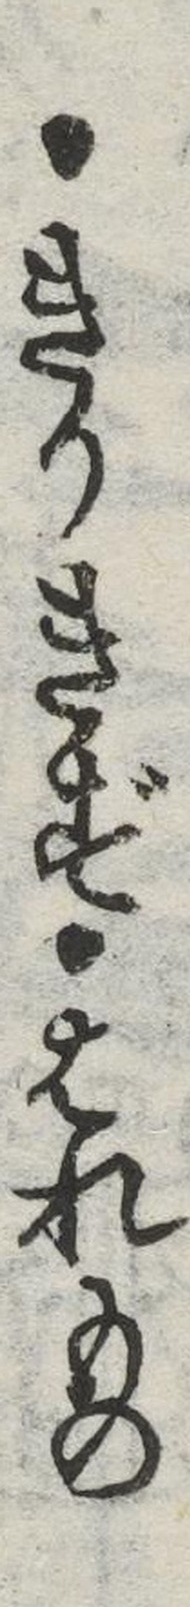●きりきず●はれもの
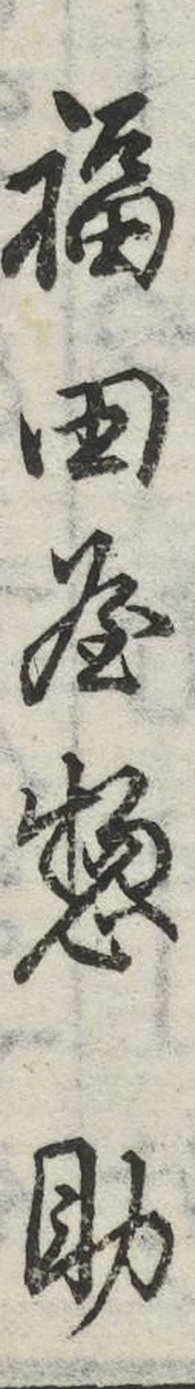福田屋惣助
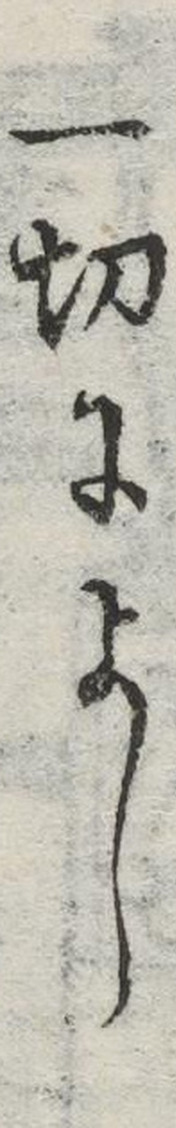一切によし
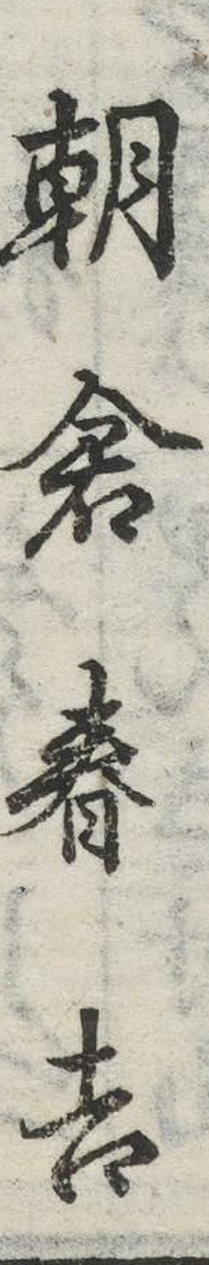朝倉春吉
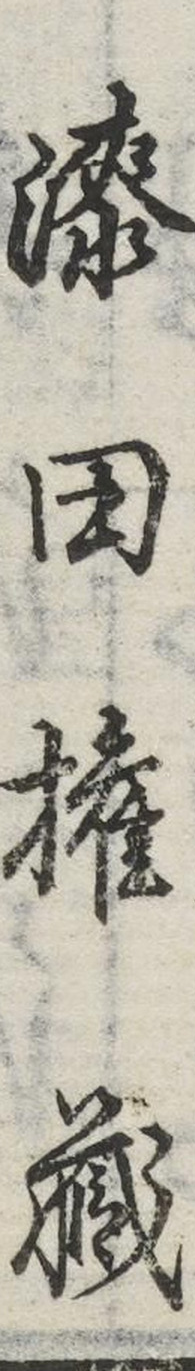漆田権蔵
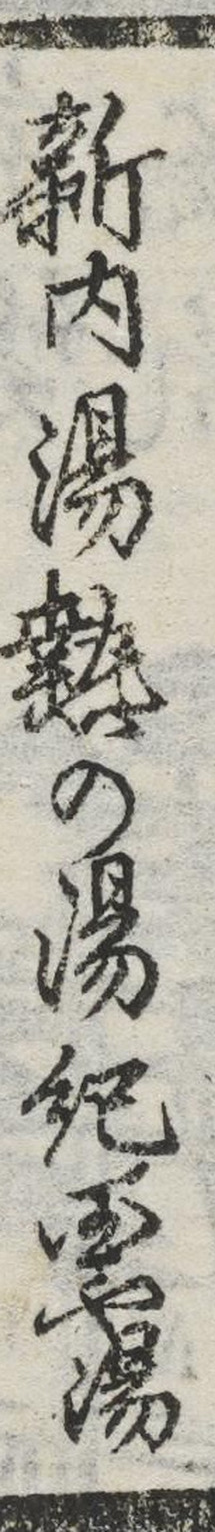新内湯熱の湯紀ノ国や湯
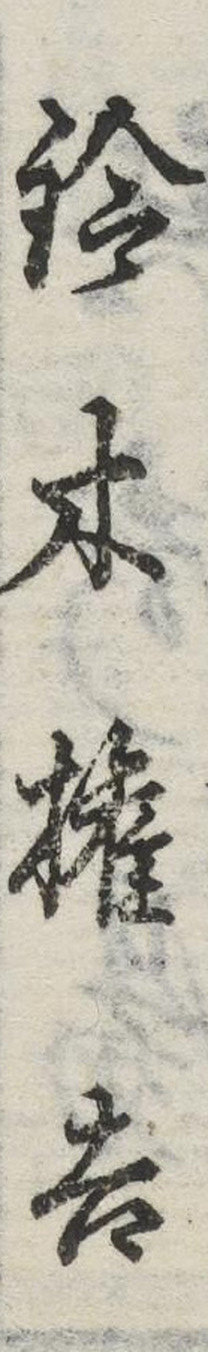鈴木権吉
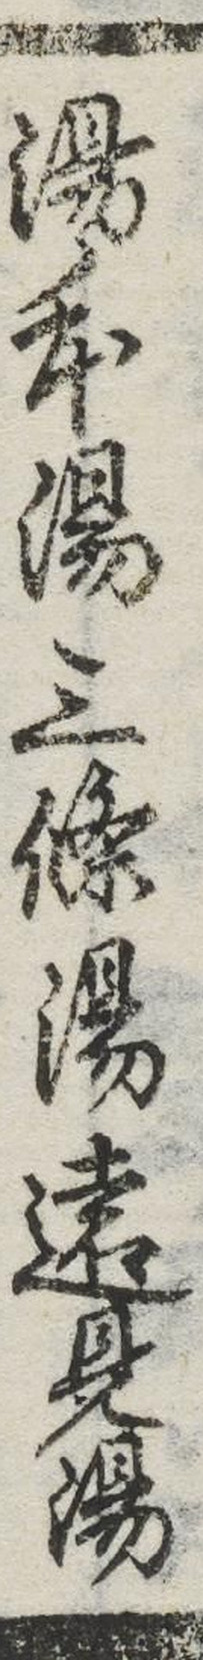湯ノ本湯三條湯遠見湯
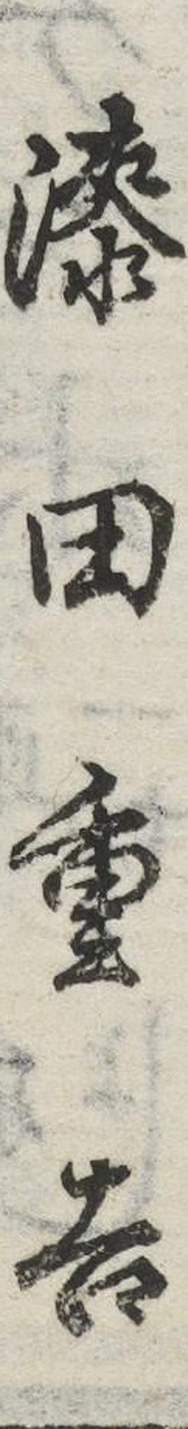漆田重吉
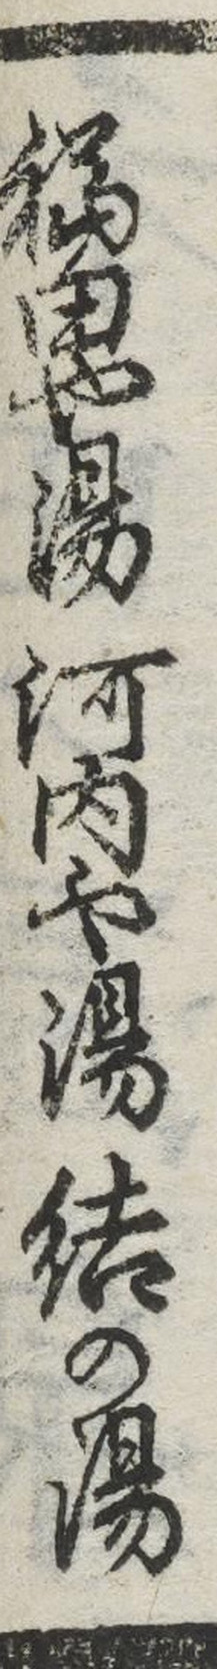福田や湯河内や湯結の湯
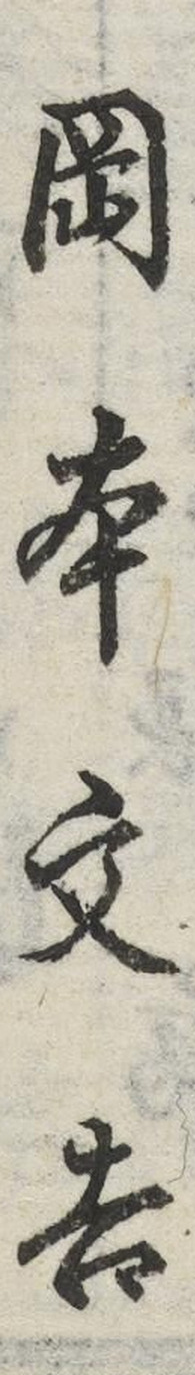岡本文吉
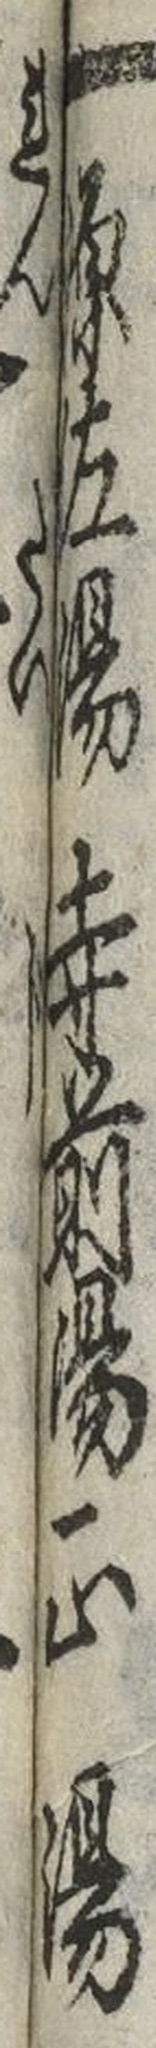源佐？湯寺前湯正湯
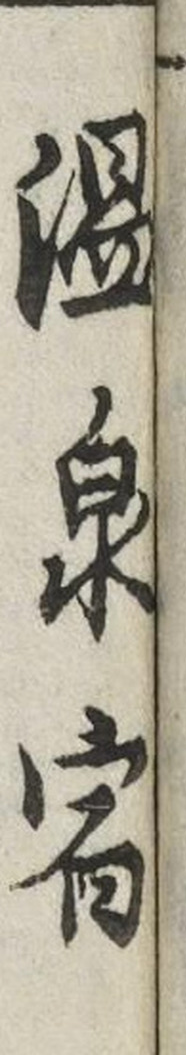温泉宿
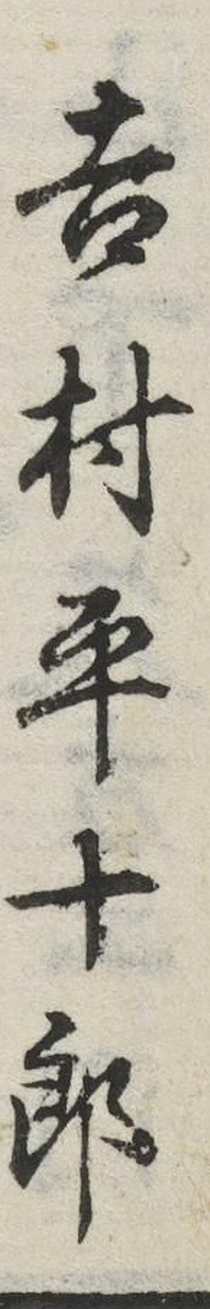吉村平十郎
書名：諸國温泉遊覽記　全
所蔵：東京大学地震研究所図書室 Earthquake Research Institute Library, The University of Tokyo, JAPAN
